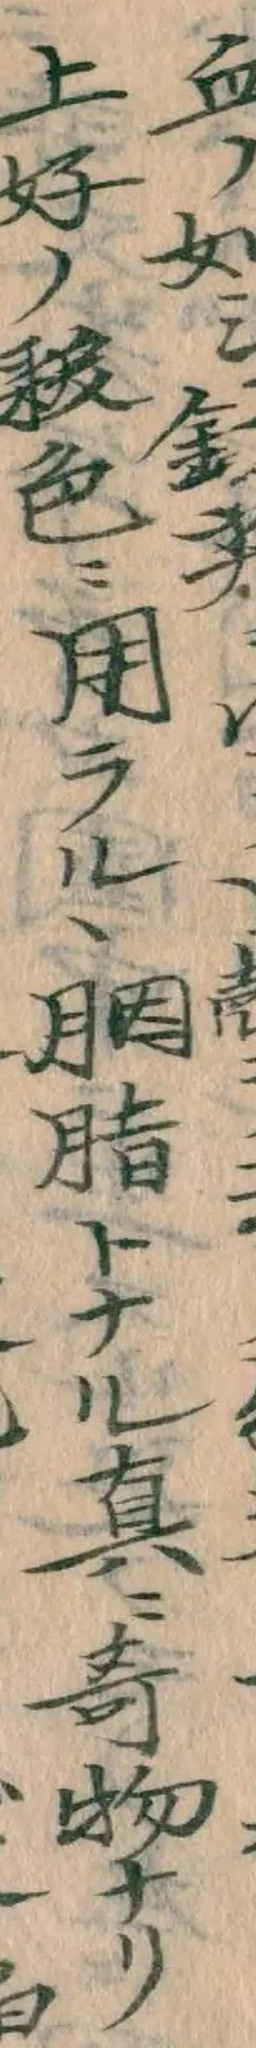上好ノ色ニ用ラルヽ胭脂トナル真ニ奇物ナリ
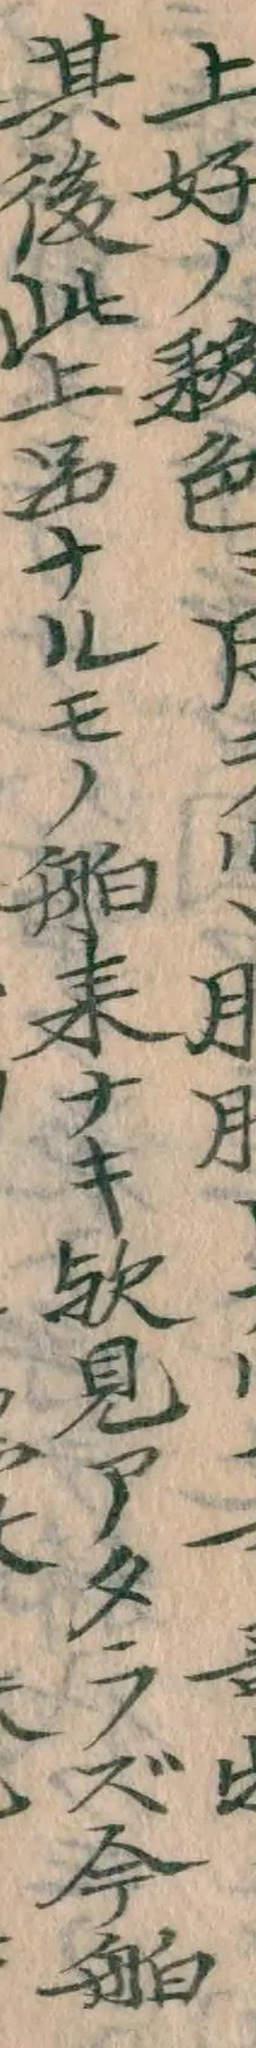其後此上品ナルモノ舶来ナキ欤見アタラズ今舶
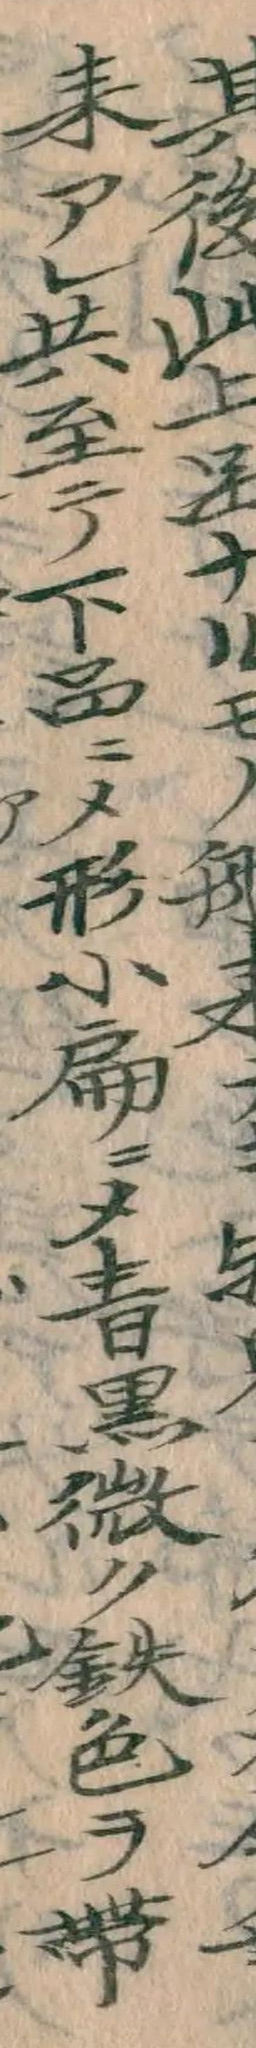来アレ共至テ下品ニシテ形小扁ニシテ青黒微ク鉄色ヲ帯
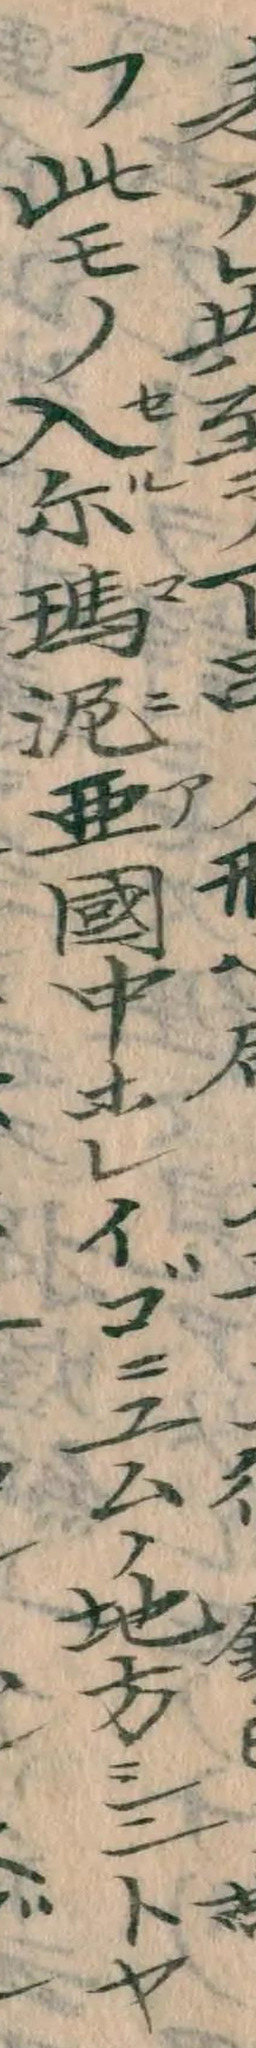フ此モノ入尓瑪泥亜国中ホレイゴニユムノ地方シントヤ
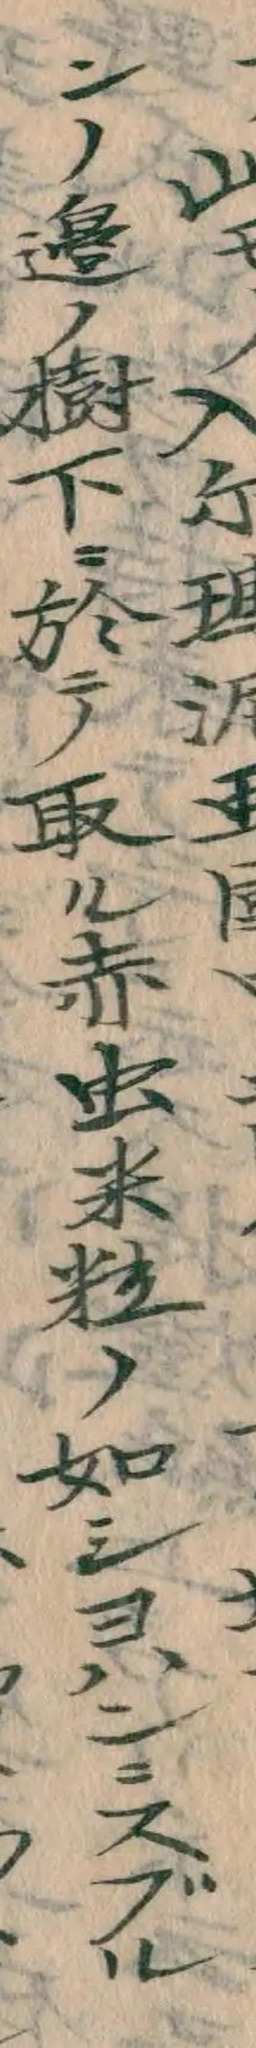ンノ辺ノ樹下ニ於テ取ル赤虫米粒ノ如シヨハンニスブル
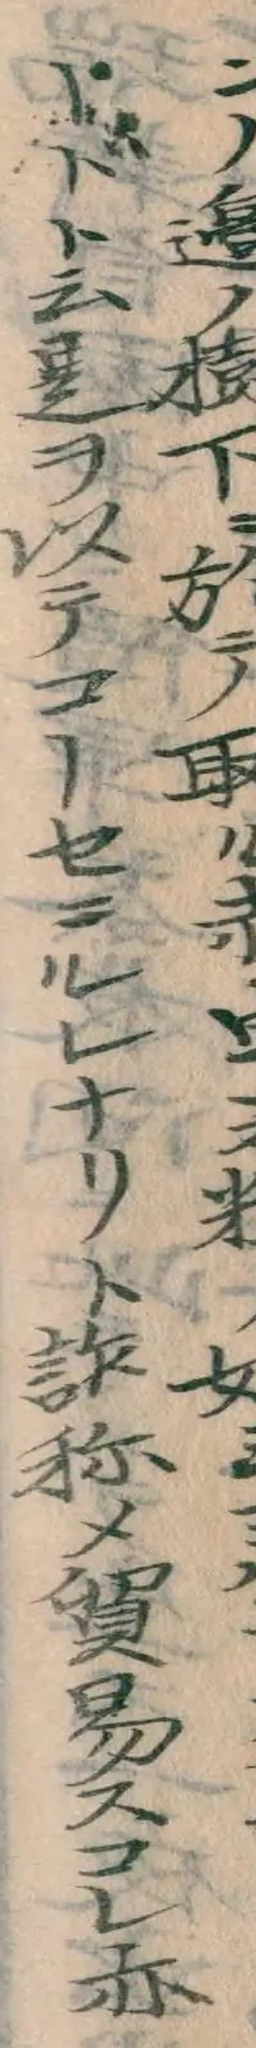ードト云是ヲ以テコーセニルレナリト詐称シテ貿易スコレ亦
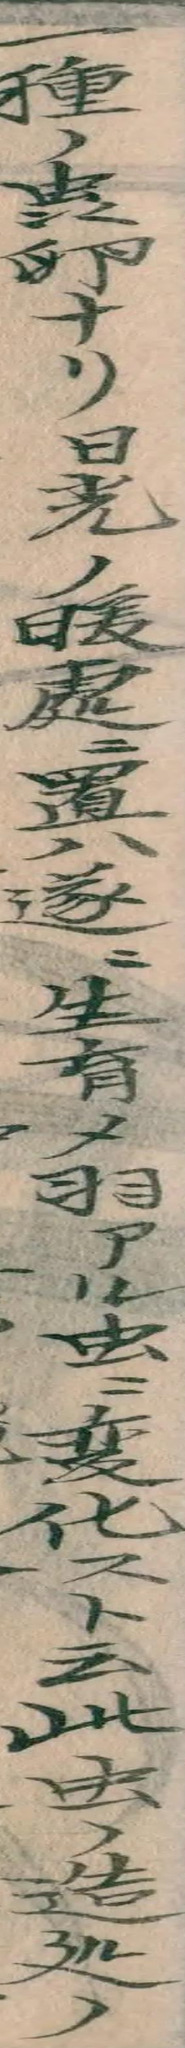一種ノ虫卵ナリ日光ノ暖處に置ハ遂ニ生育シテ羽アル虫ニ変化スト云此虫ノ造処ノ
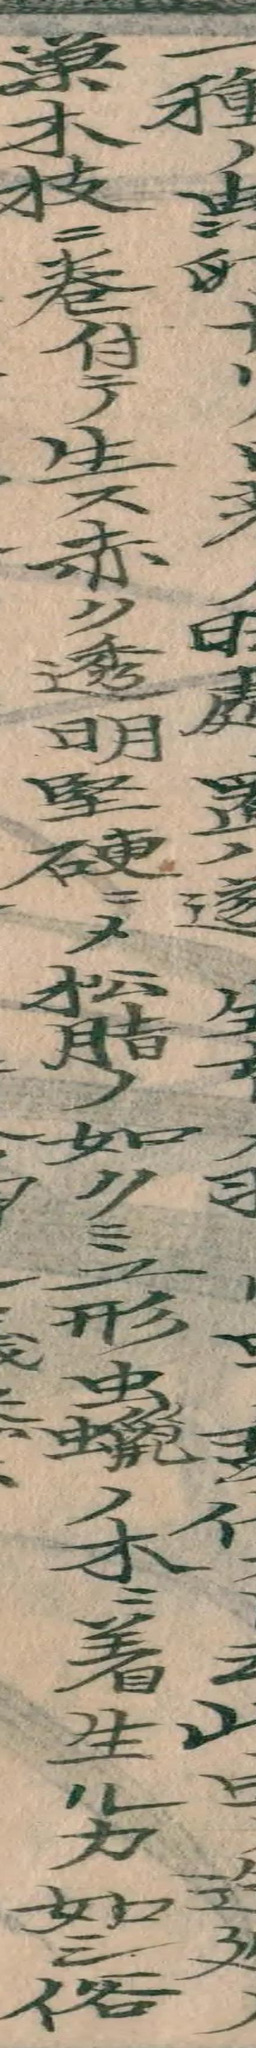巣木枝ニ巻付テ生ス赤ク透明堅硬ニシテ松脂ノ如クミユ形虫蝋ノ木ニ着生ルカ如シ俗
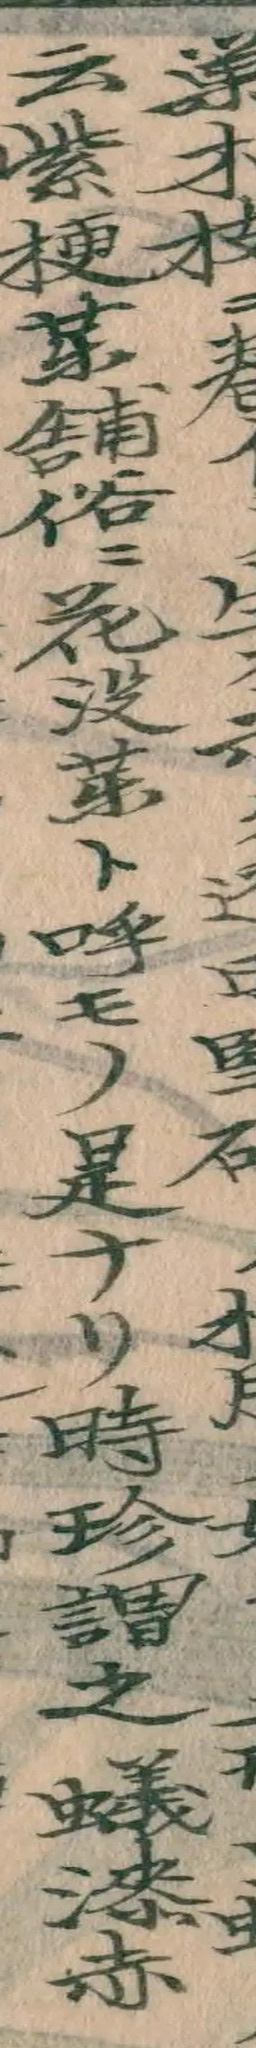云紫梗薬舗俗ニ花没薬ト呼モノ是ナリ時珍謂之蟻漆赤
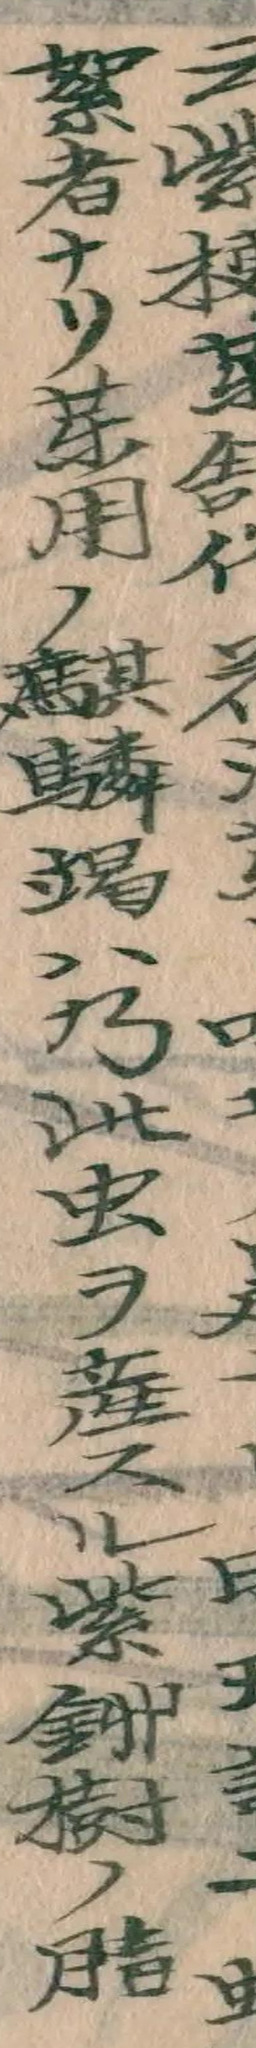絮者ナリ薬用ノ麒麟竭ハ乃此虫ヲ産スル紫𨥥樹ノ脂
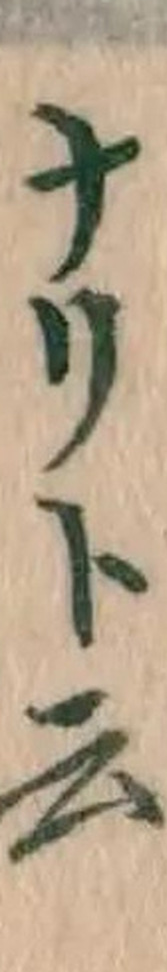ナリト云
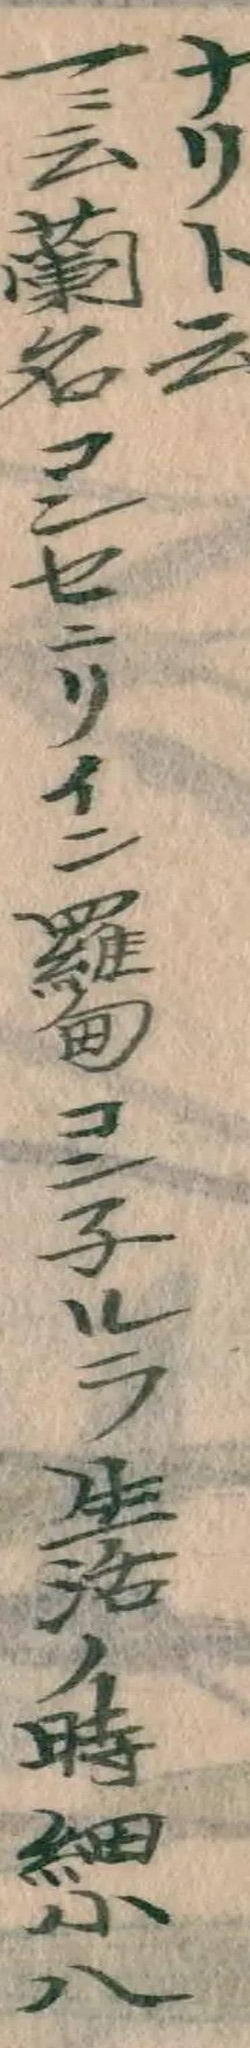一ニ云蘭名コンセニリイン羅甸コンネルラ生活ノ時細小八
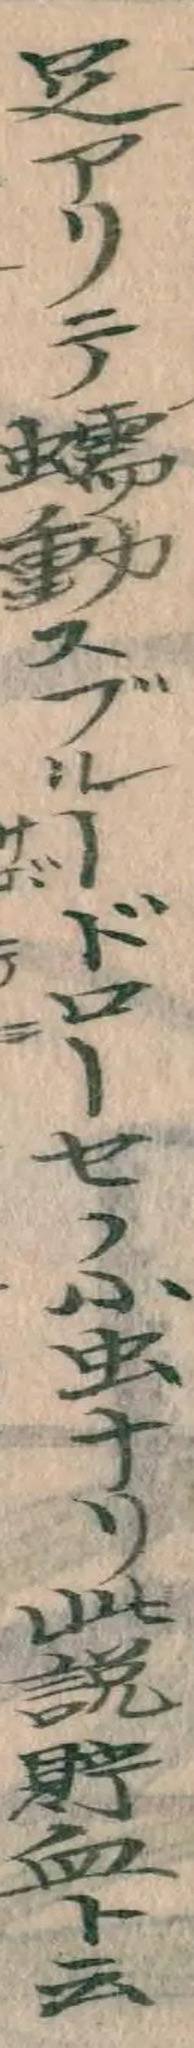足アリテ蠕動スブルードローセノ小虫ナリ此説貯血ト云
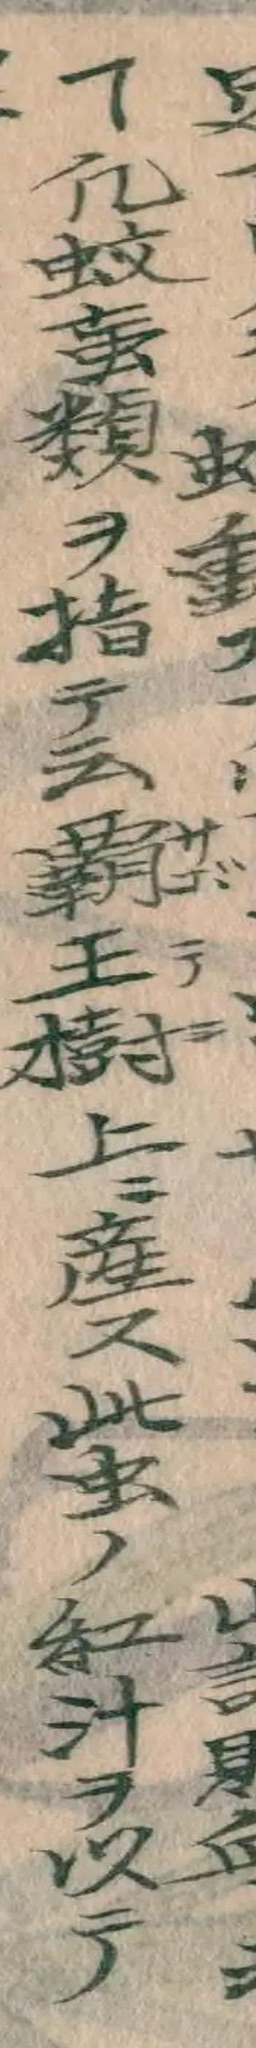コト凡蚊虻類ヲ指テ云覇王樹上ニ産ス此虫ノ紅汁ヲ以テ
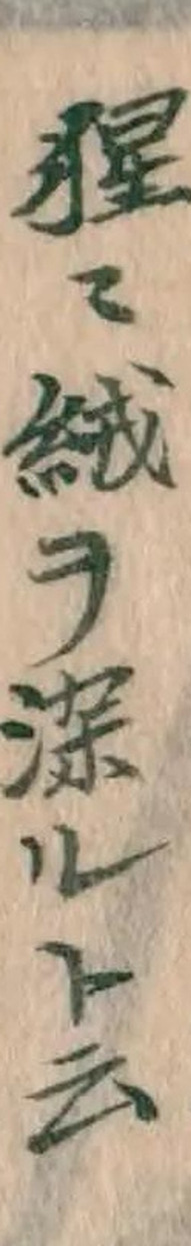猩々絨ヲ染ルト云
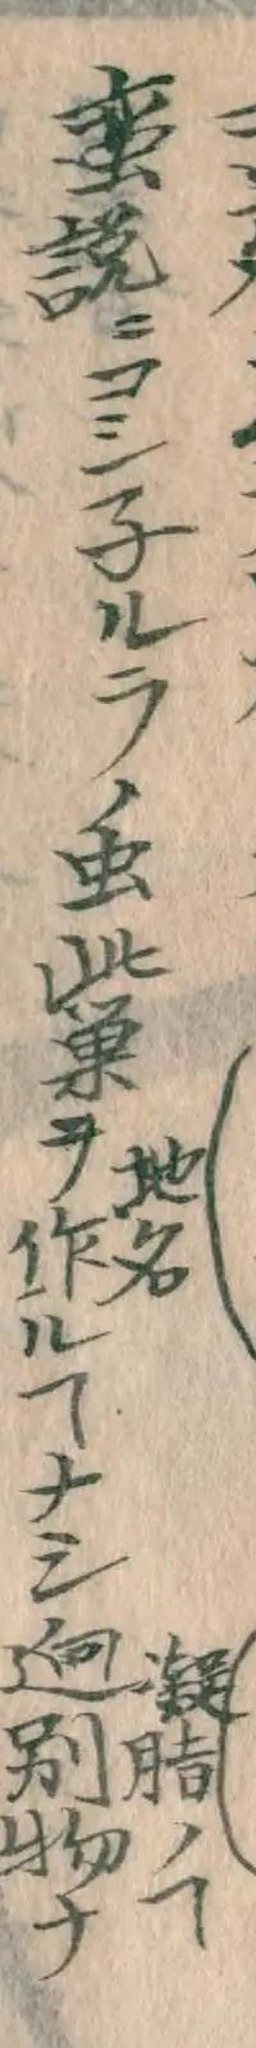蛮説ニコシネルラノ虫此巣ヲ作ルコトナシ逈別物ナ
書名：千蟲譜 3巻. [3]
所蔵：国立国会図書館 National Diet Library, JAPAN
